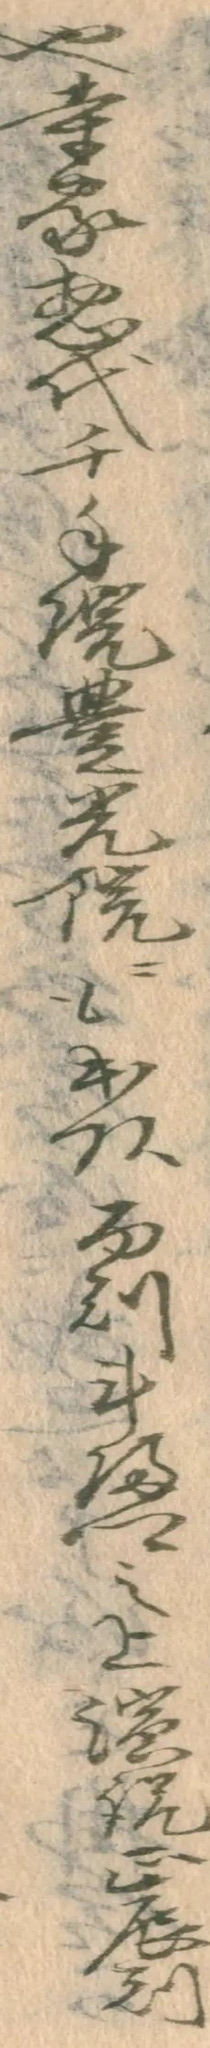也寺家惣代千手院豊光院ニも出頭酉刻計帰郷之上演説正辰刻
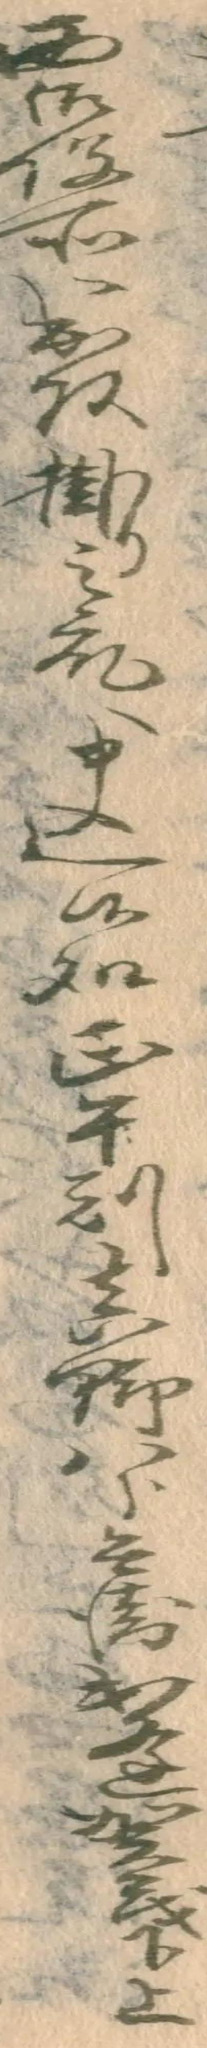西御役所へ出頭掛り之衆へ申込候処正午刻真野八郎兵衛出逢賀茂下上
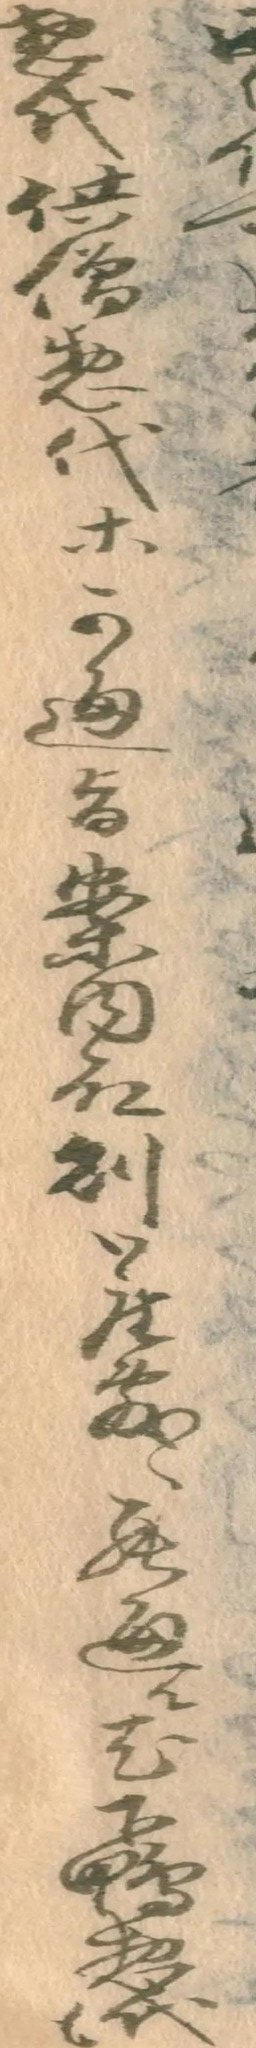惣代供僧惣代等可通旨案内衆別御座敷へ罷通ル尤下鴨惣代も
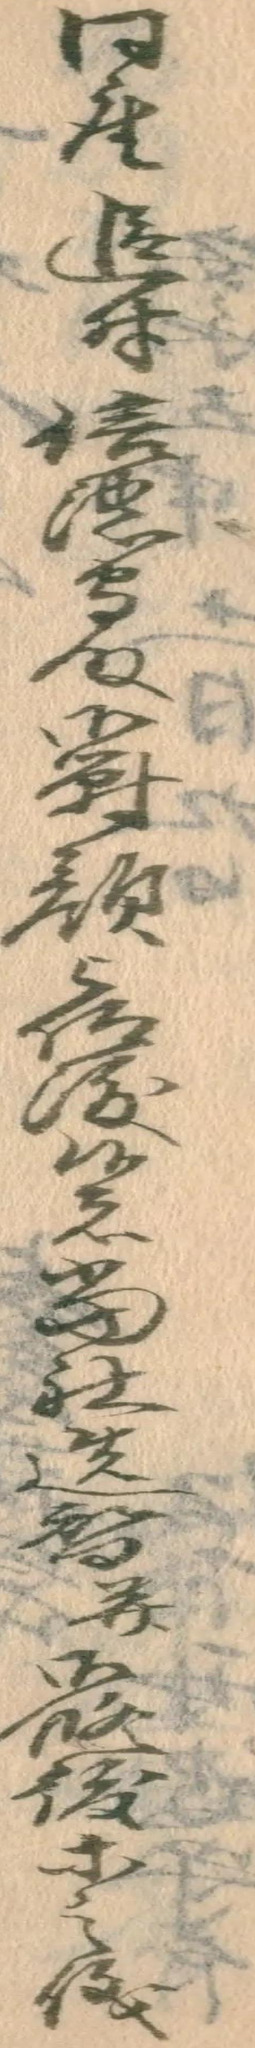同座追付信濃守殿御対顔被仰渡候は当社造替并御修復等之儀
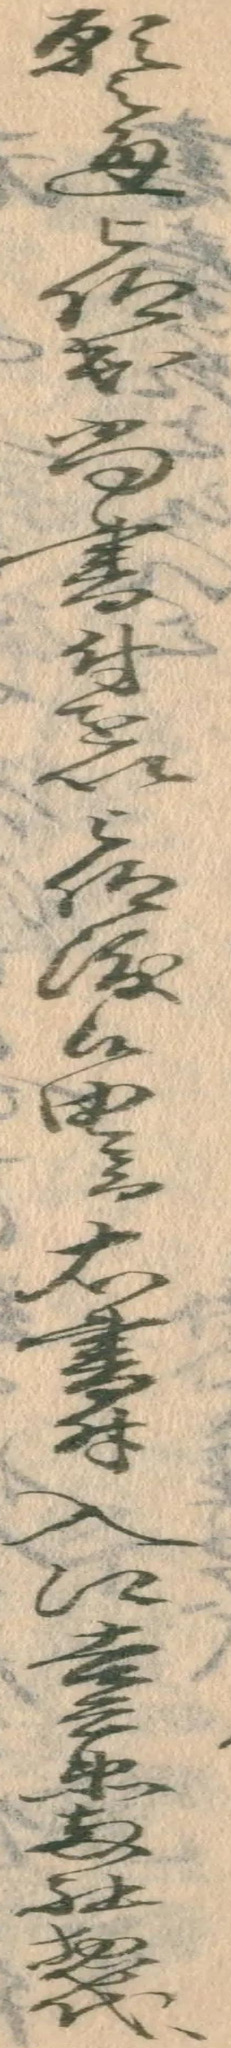願之通被仰出当書付を以被仰渡候由ニ而右書付入江吉兵衛両社惣代へ
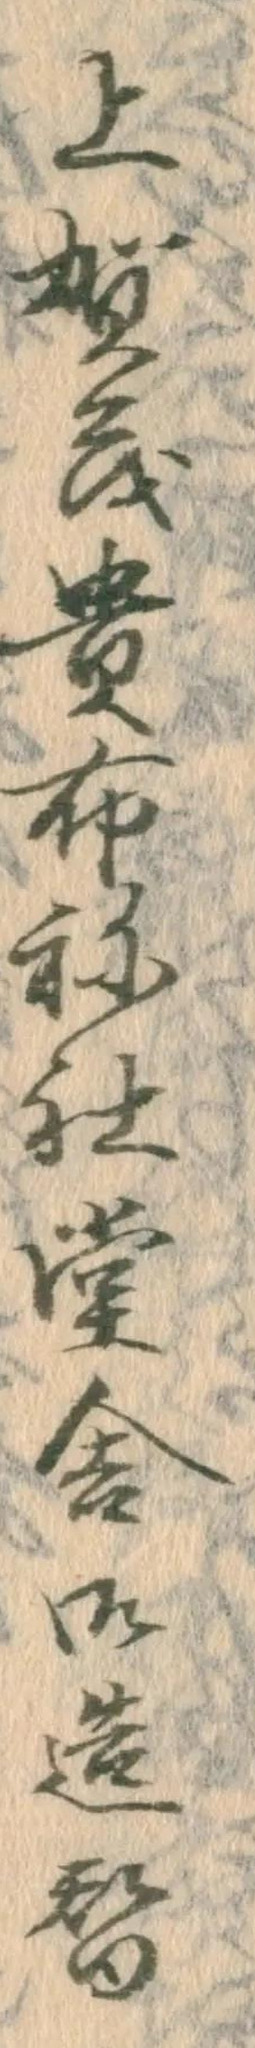上賀茂貴布祢社堂舎御造替
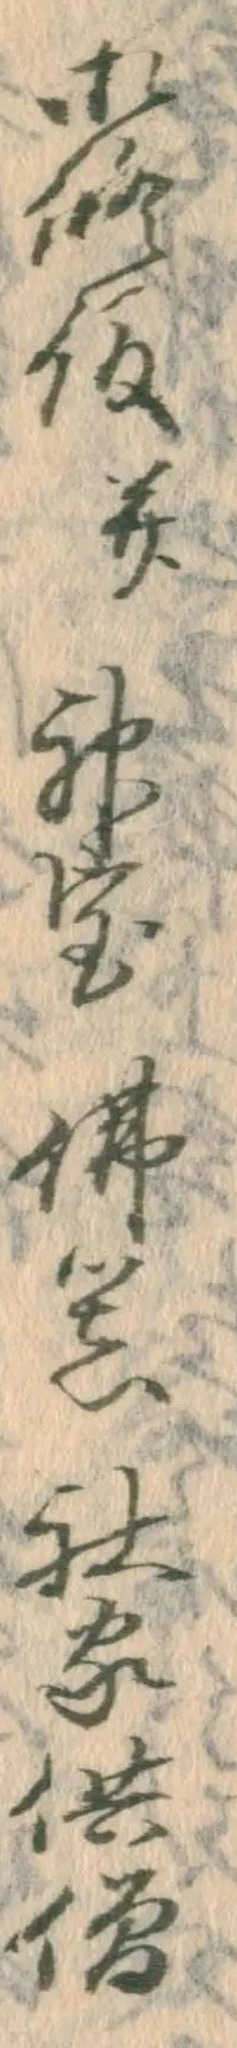御修復并神宝仏器社家供僧
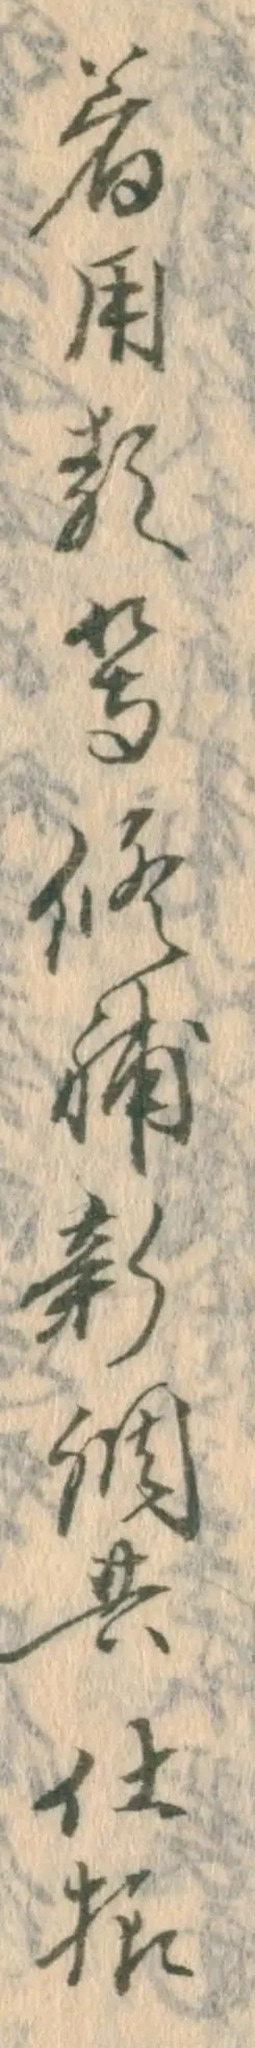着用類等修補新調共仕様
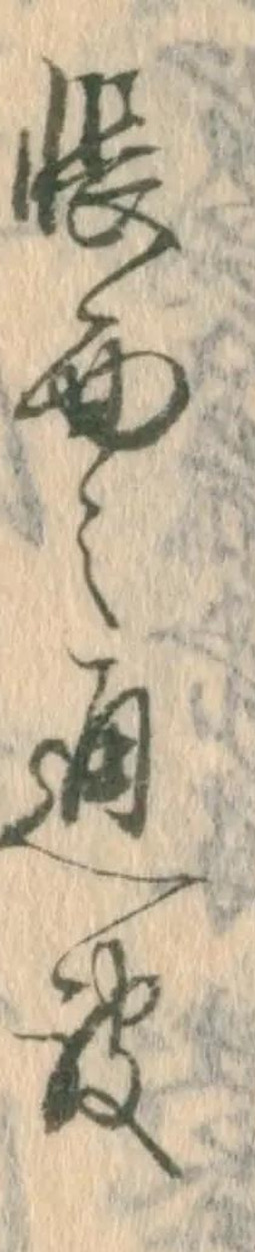帳面之通被
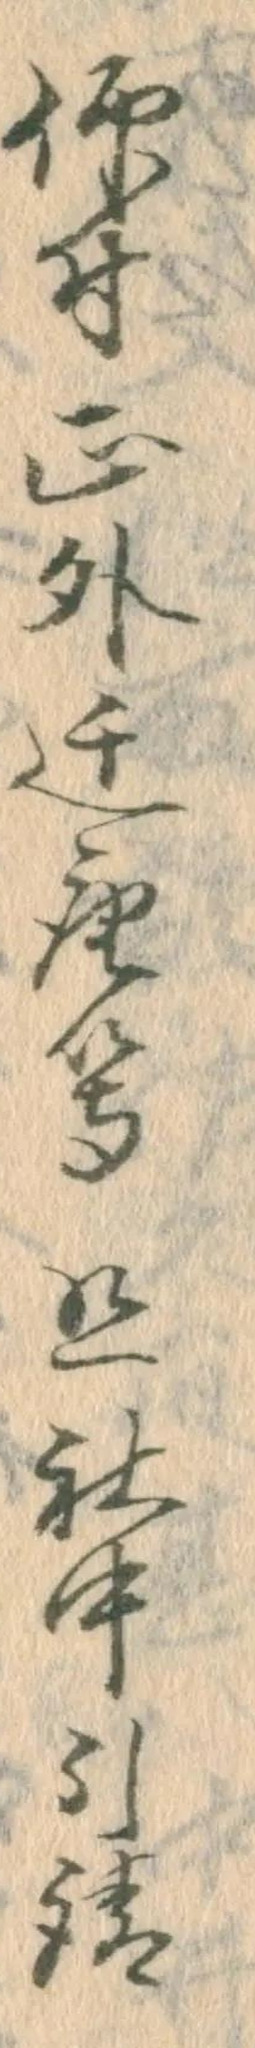仰付正外迁座等且社中引請
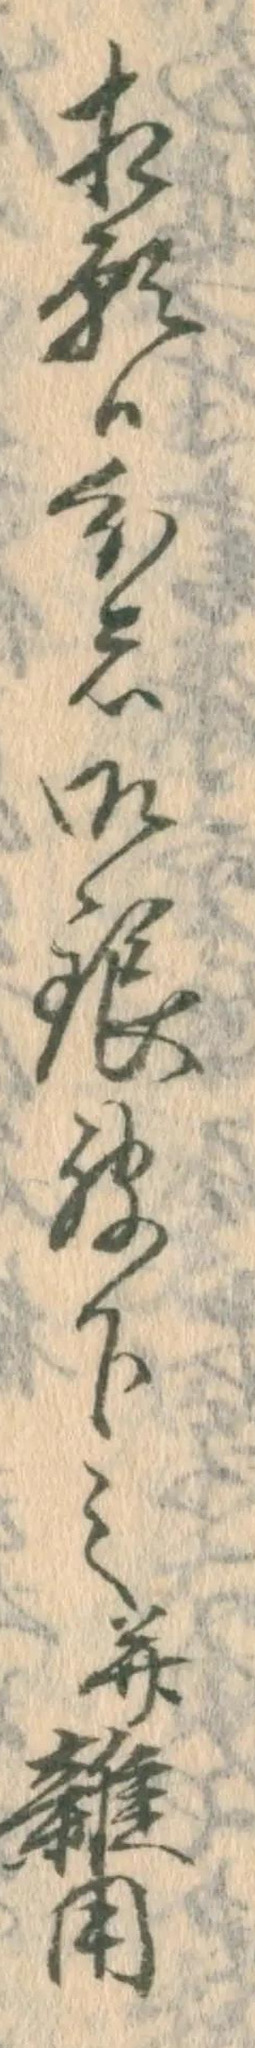相願候分者御銀被下之并雑用
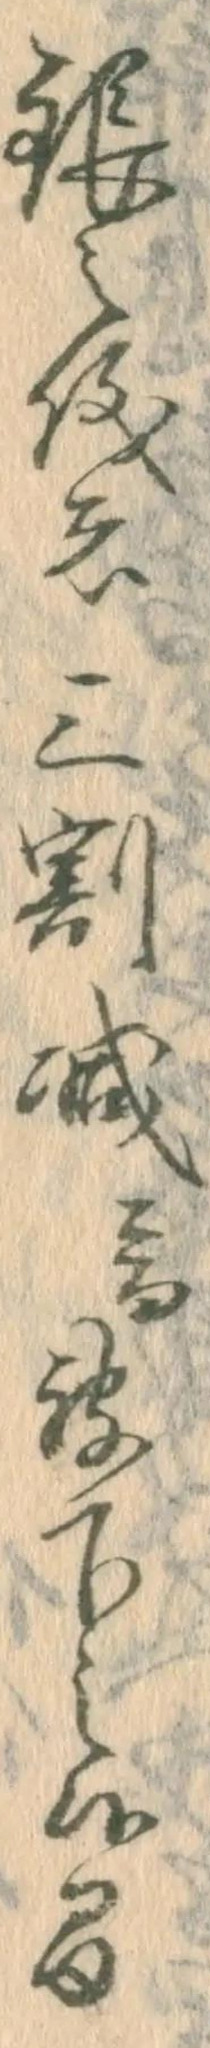銀之儀者三割減ニ而被下之候間
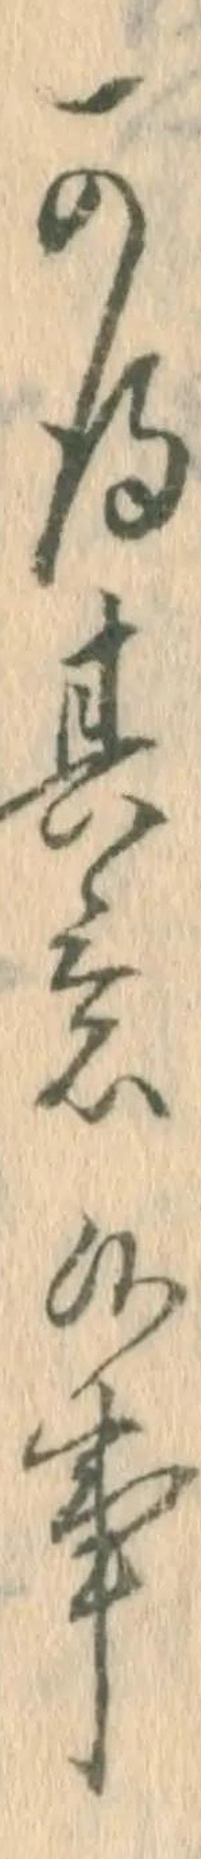可得其意候事
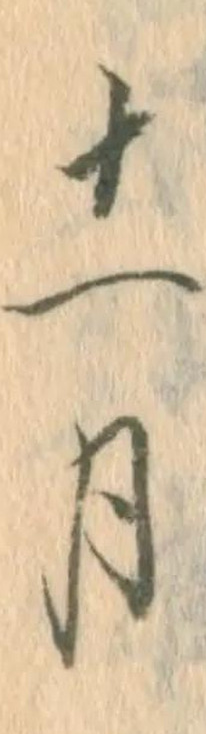十一月

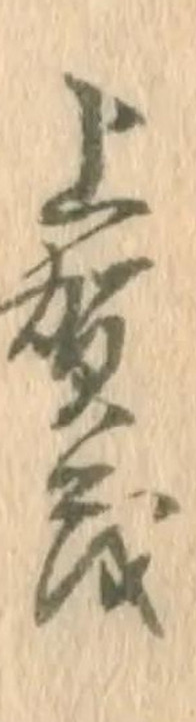上賀茂
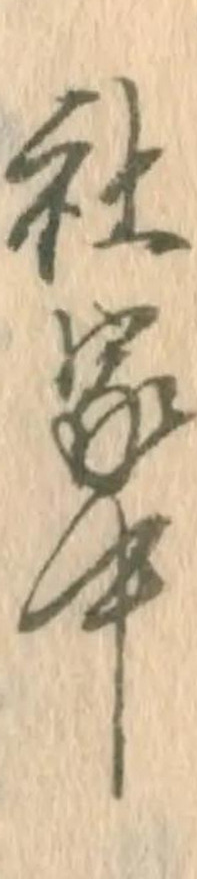社家中
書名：賀茂社記録. 第17冊
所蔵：国立国会図書館 National Diet Library, JAPAN
